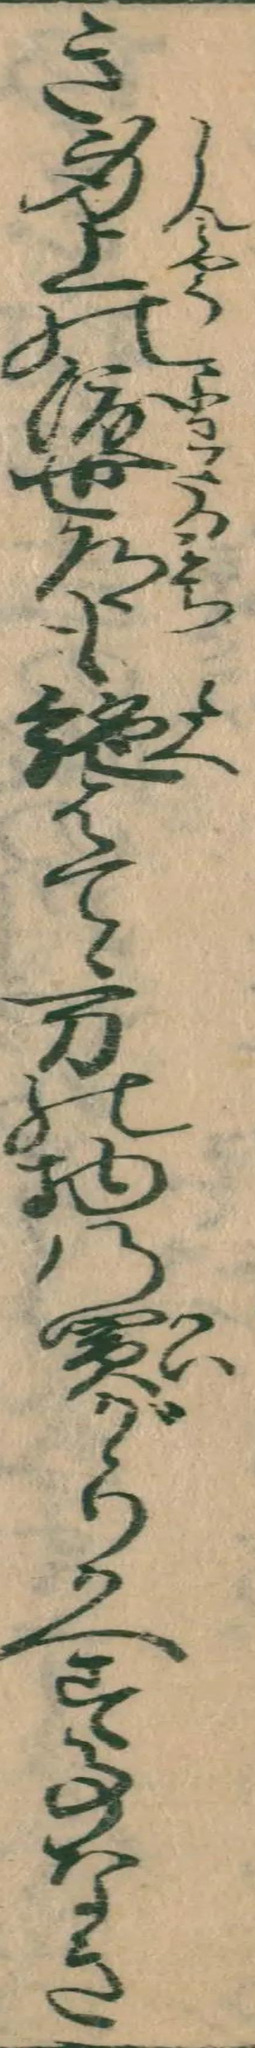き身上の渡世道も絶はてゝ万の物の買がゝりかへす事なき
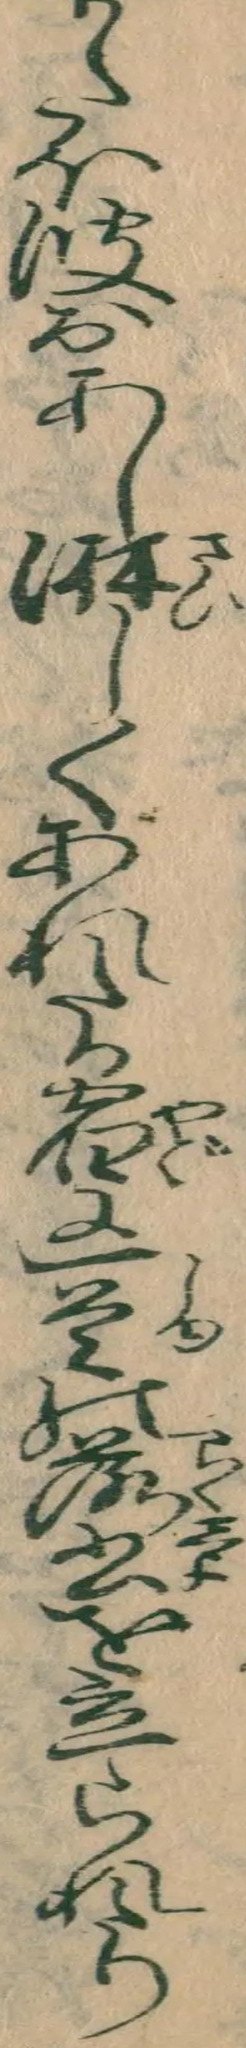かたほ波おあし淋し〱あれたる宿に一首の落書を立られたり
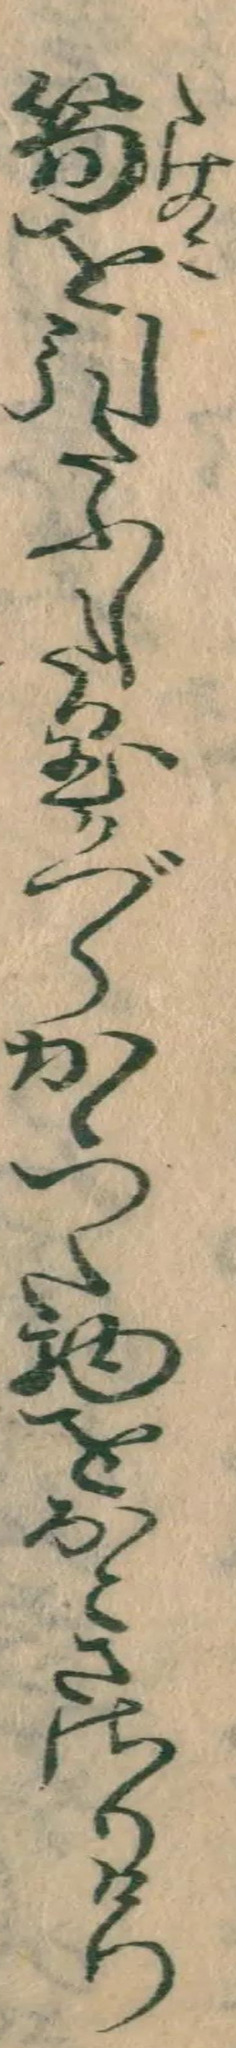筍を引たふしたる玉かづらかゝつた物をおとささりけり
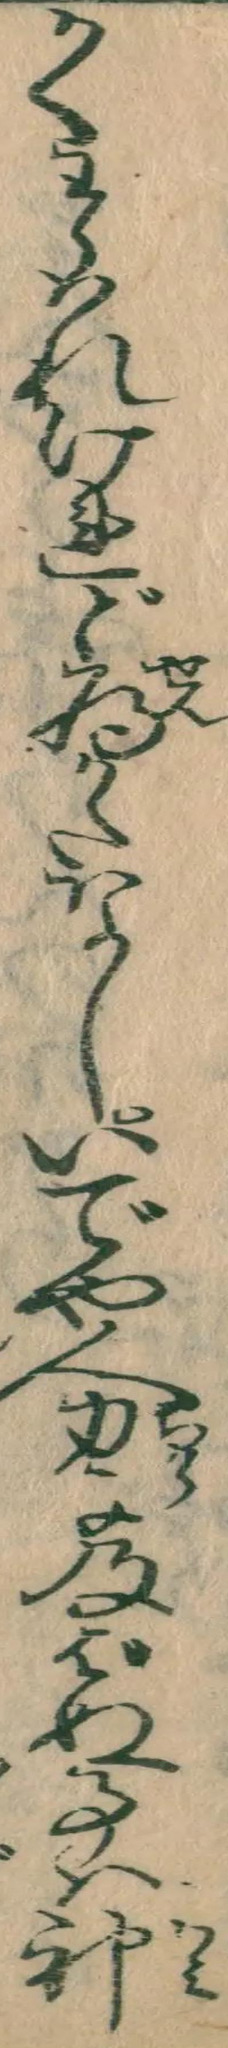かくわらはれけれど為かたなし。いでや人力に及ばぬ事は神
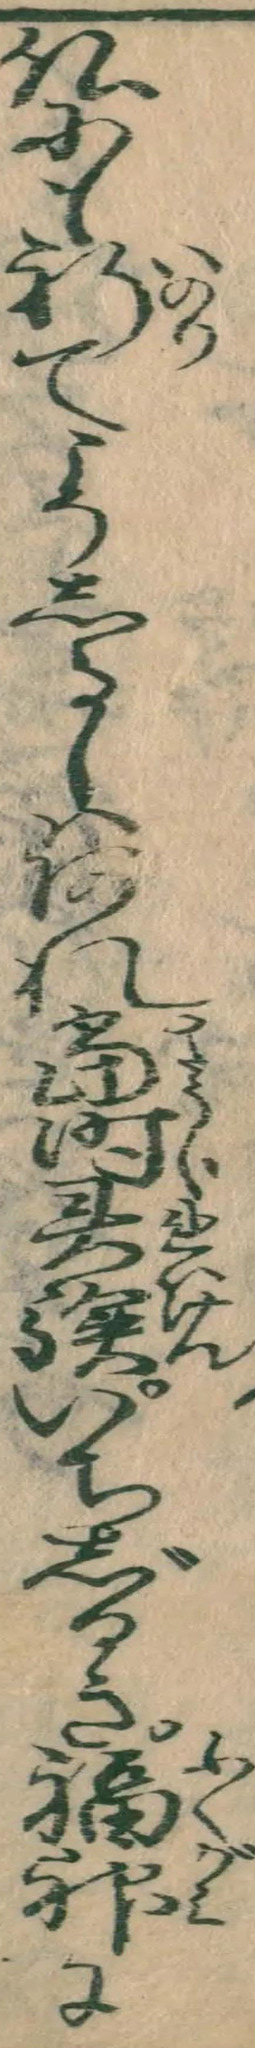仏にも祈てこそしるしはあれ当時霊験。いちじるき。福神に
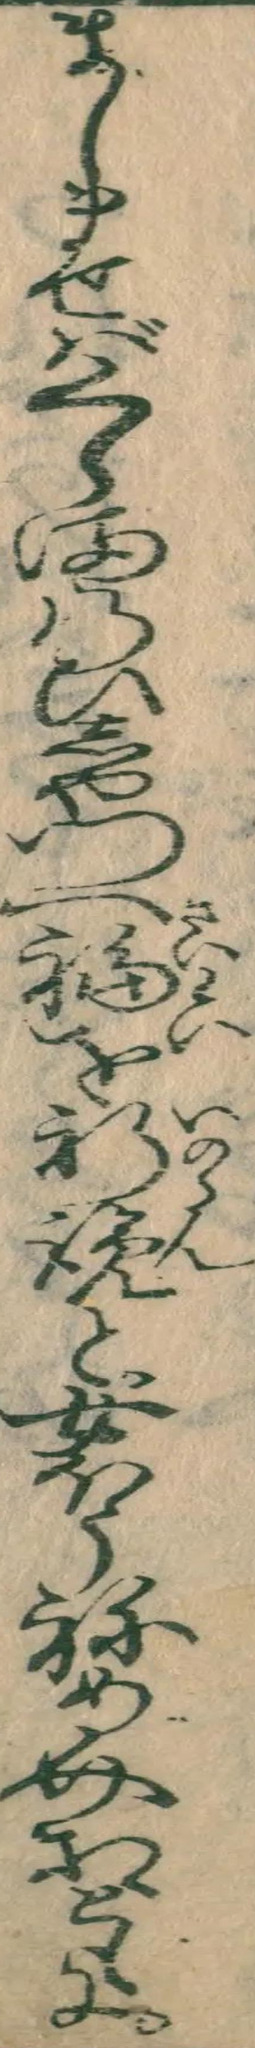ましませばくらまのひしや門へ福を祈覧と。女ほうねめ介相ともに。
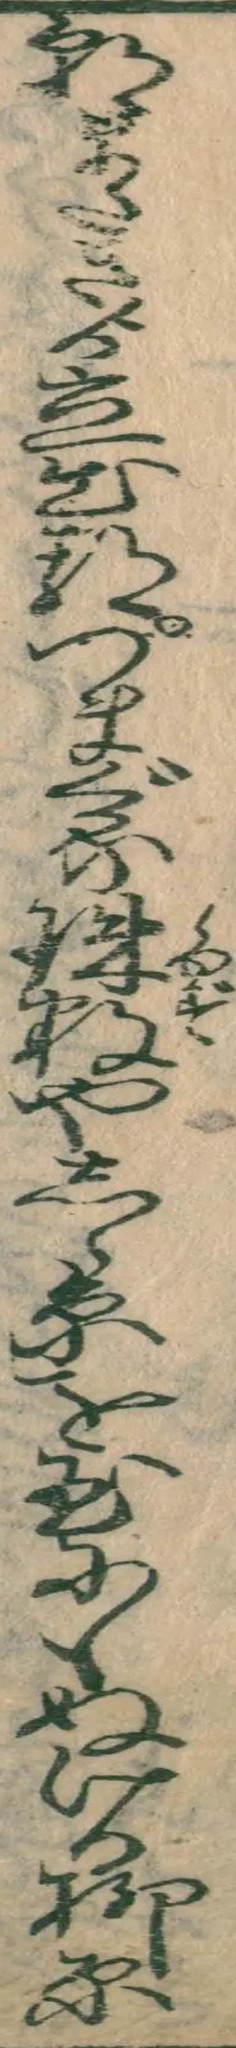朝またきゟ立出る。つまぐる珠数やしら糸を玉にもぬける柳原
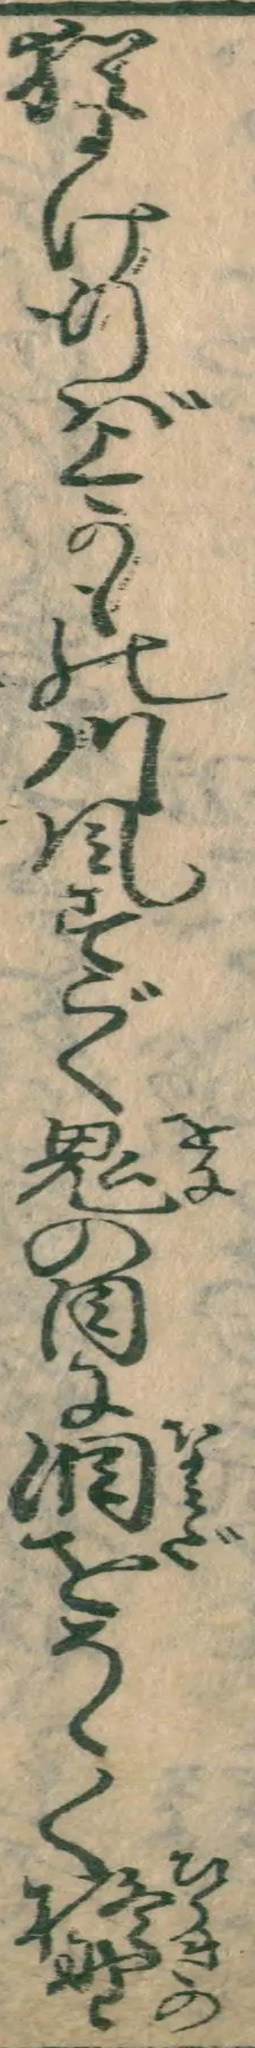猶わけ行ば上かもの川風すごく鬼の目に泪をそゝ〱柊野
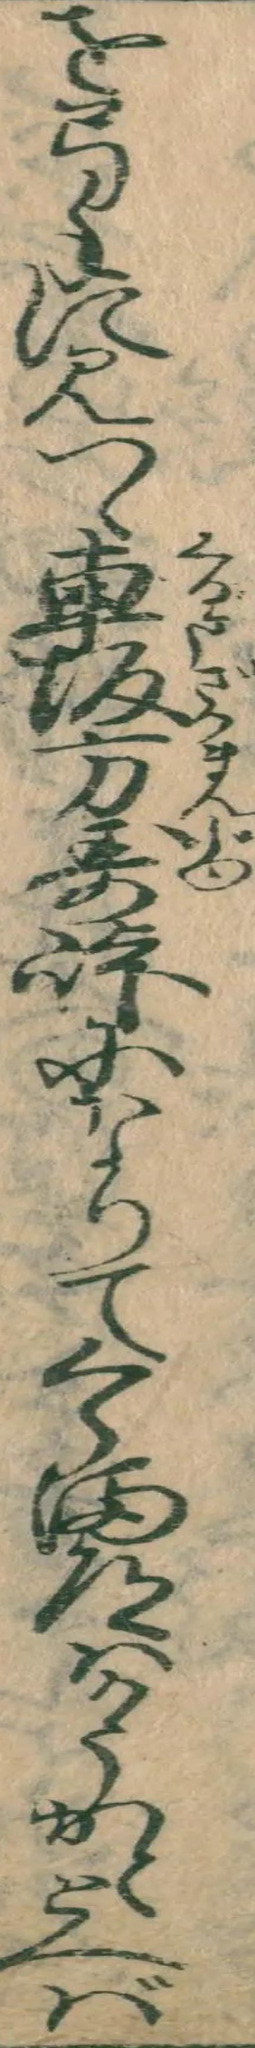を弓手に見つゝ車坂万寿峠になりてくらま道はかうかととへば

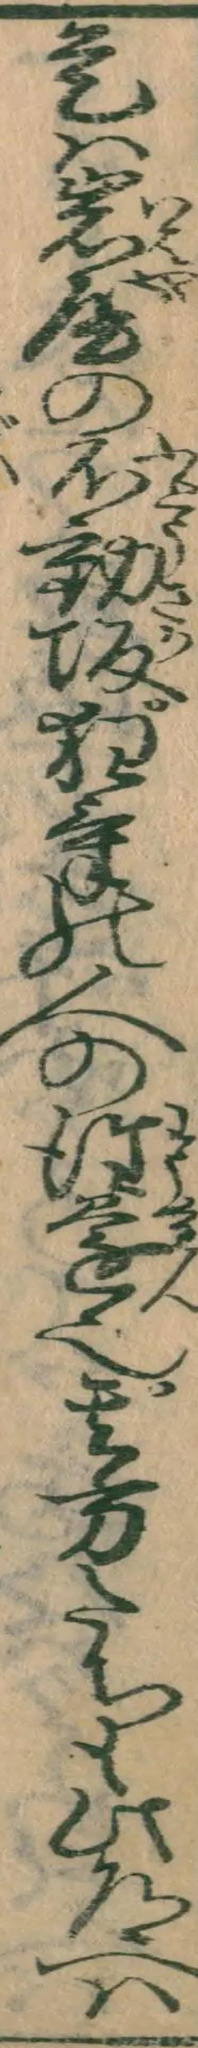是は岩屋の不動坂。狂気の人の往還也。其方たちも此道へは
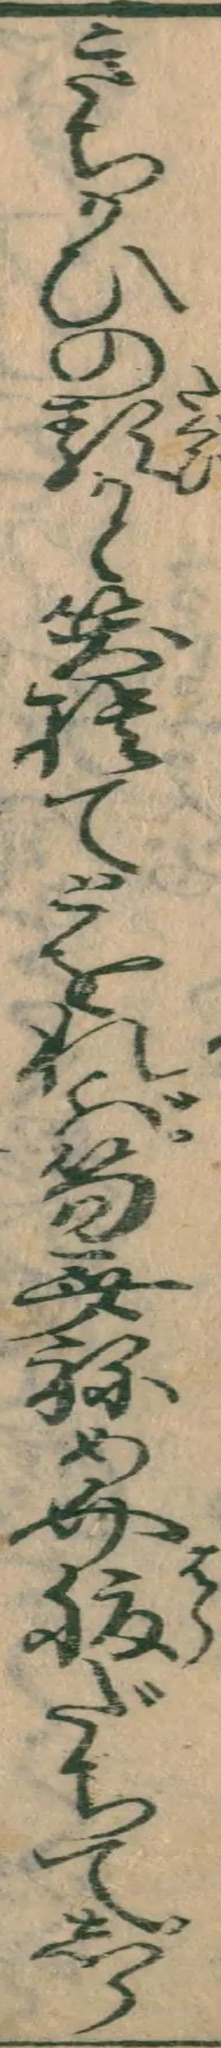きちかひの類かと笑捨てとをれば。筍斎ねめ介腹だちて。しら
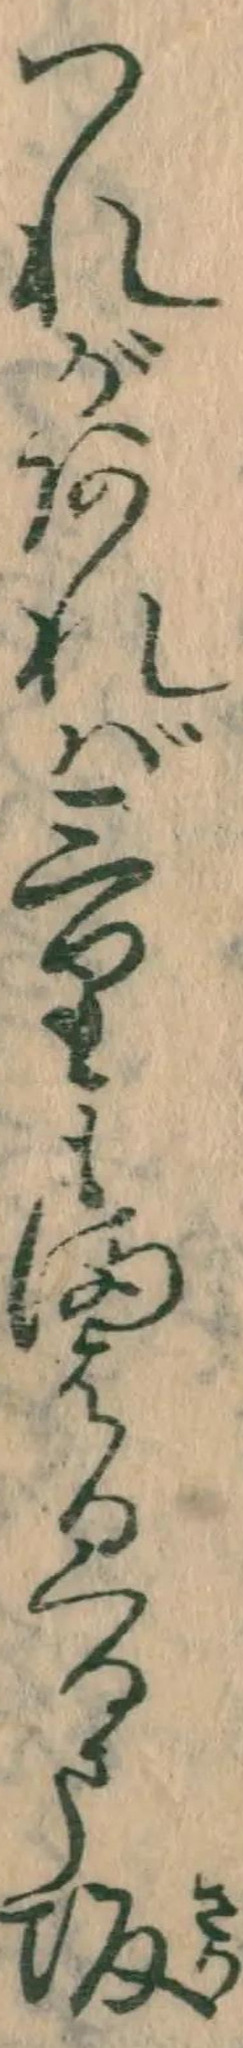つれがあれば三里もまはるくるま坂
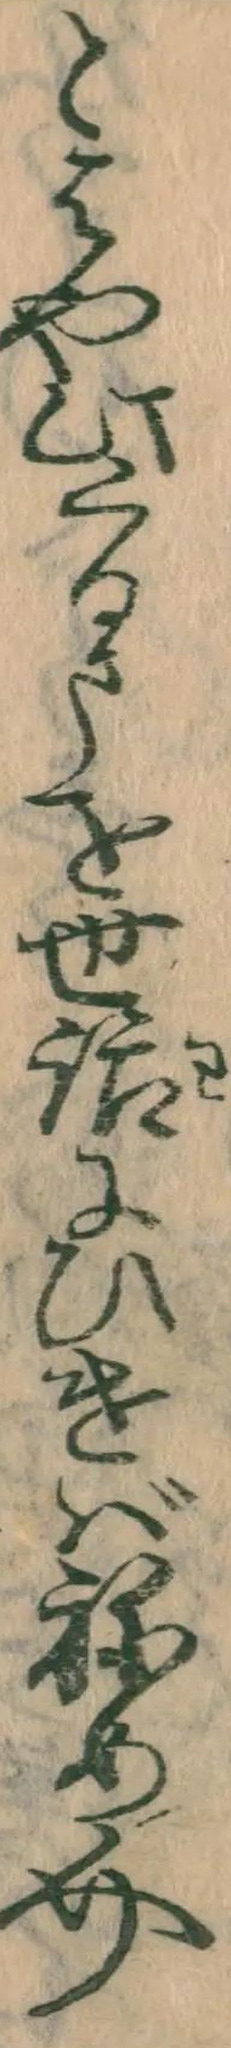とはや此くるまを世話にひけばねめ介
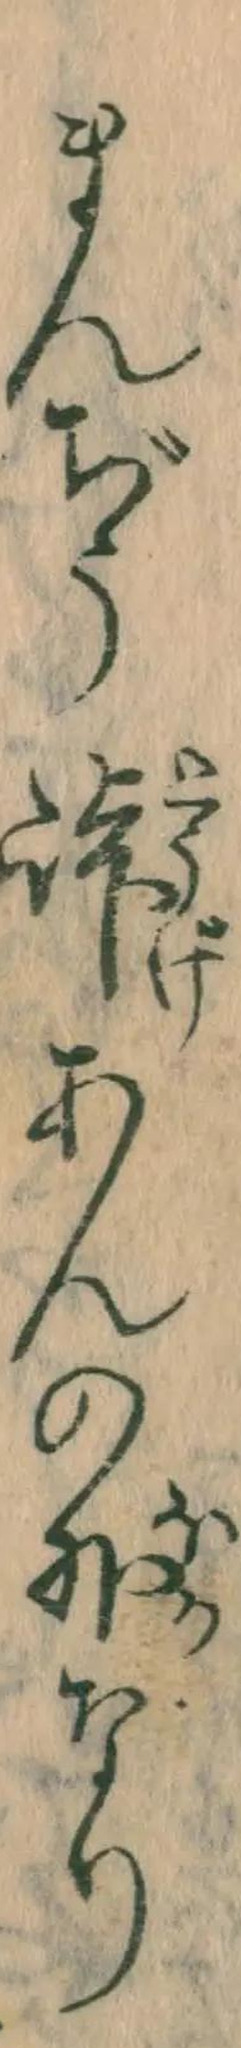まんぢう峠あんの外なり
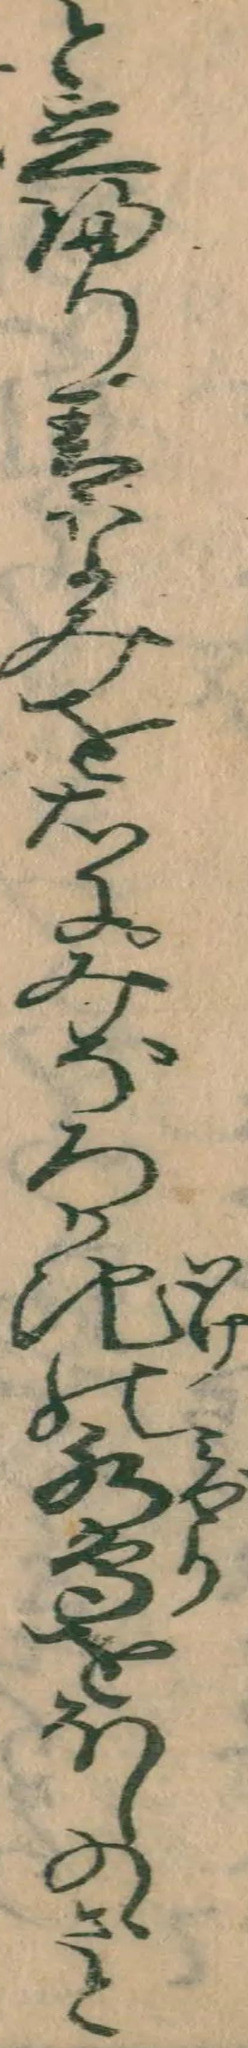と立帰り青なみを右に。みぞろか池の水鳥をほしのゝさと
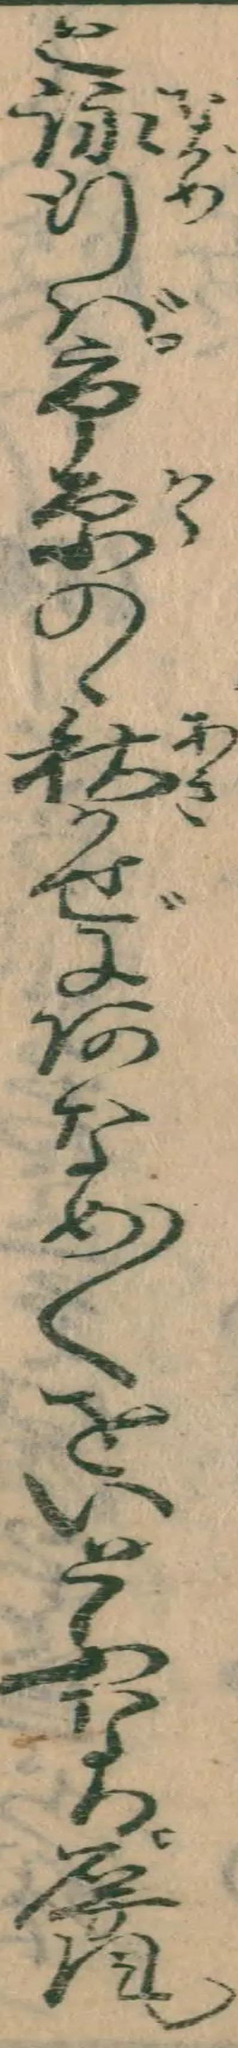と詠行ば。市原のゝ秋かぜにあなめ〳〵をいとふなる。屏風
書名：新竹斎 5巻
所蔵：国立国会図書館 National Diet Library, JAPAN
